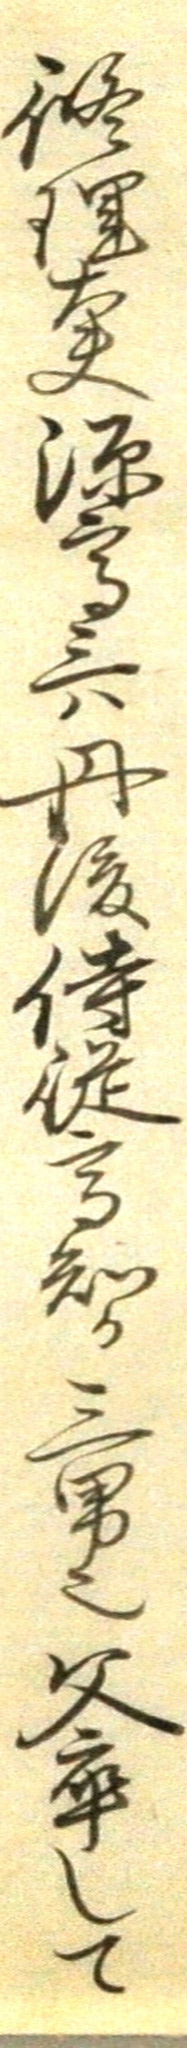修理大夫源高三は丹後侍従高知か三男也父卒して
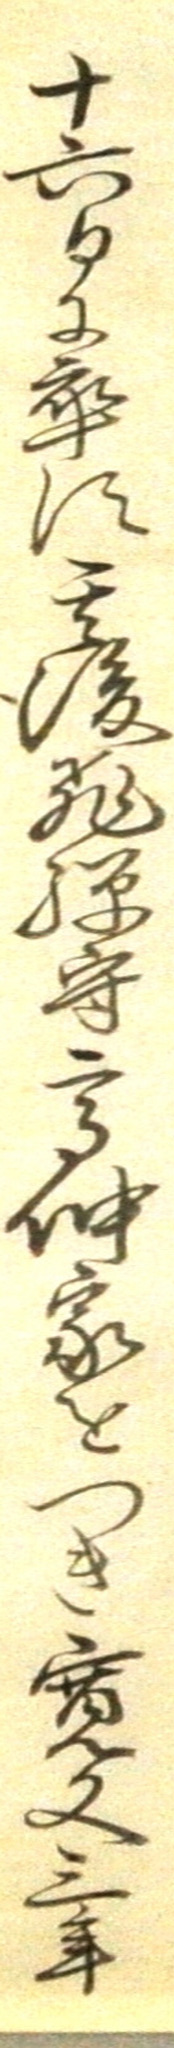十六日に卒す其後飛騨守高仲家をつき寛文三年
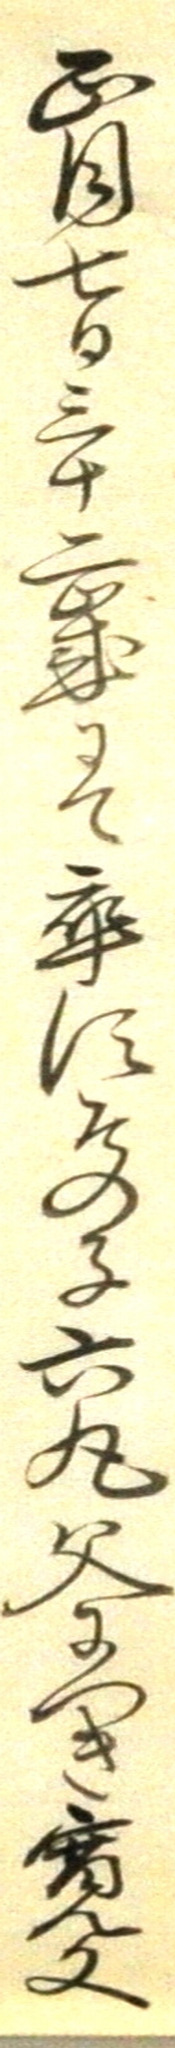正月七日三十二歳にて卒すその子六丸父につき寛文
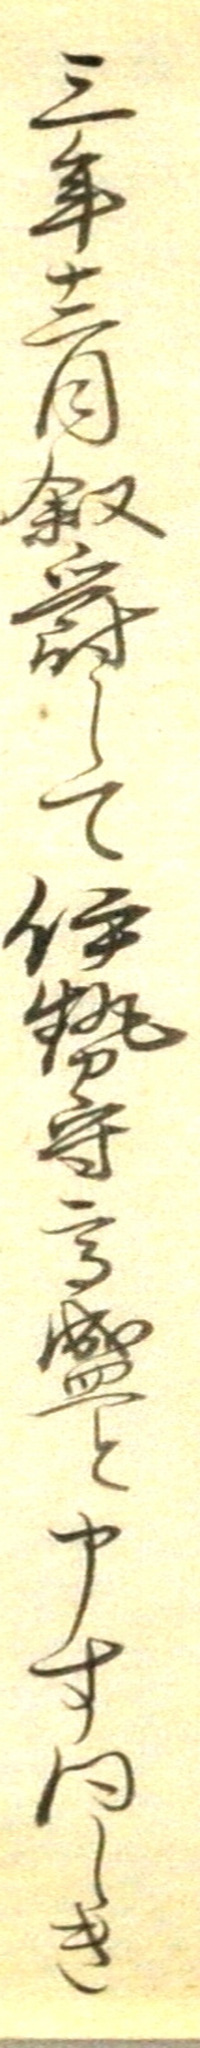三年十二月叙爵して伊勢守高盛と申す同しき
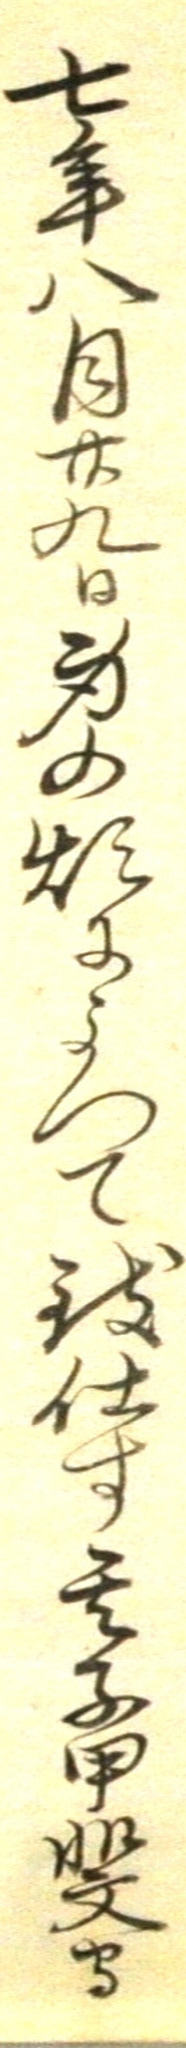七年八月二十九日身の煩によつて致仕す其子甲斐守
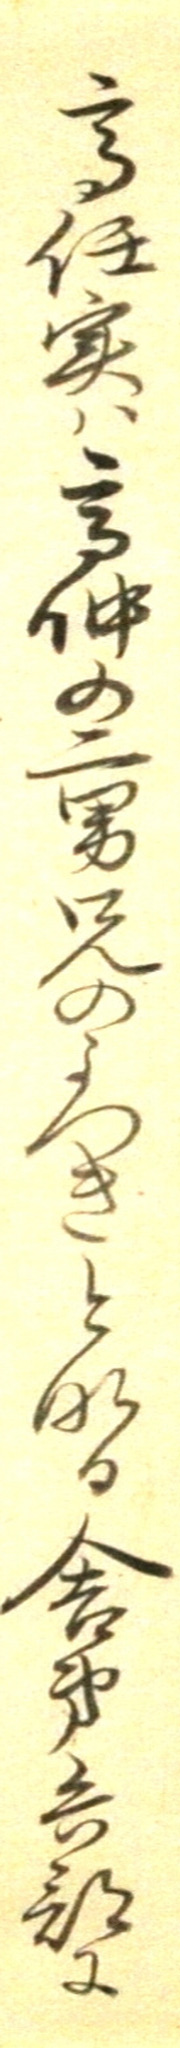高任実は高仲の二男兄のよつきとなる舎弟兵部に
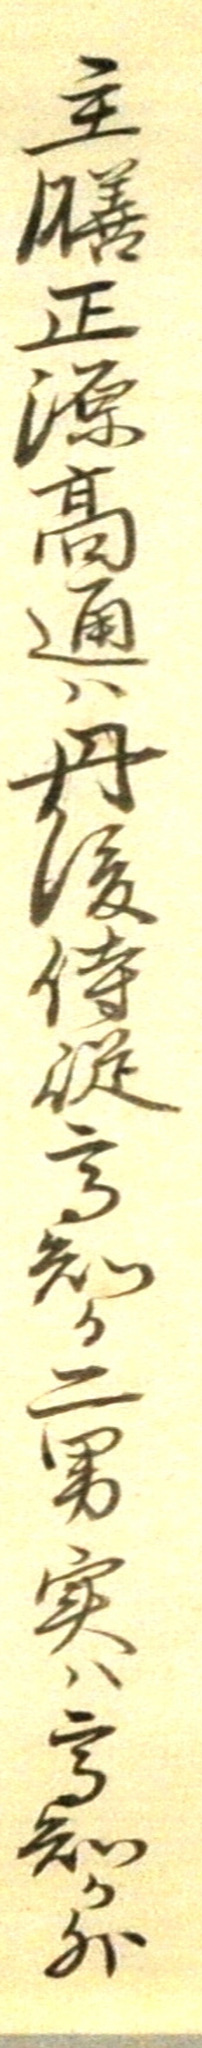主膳正源高通は丹後侍従高知か二男実は高知か外
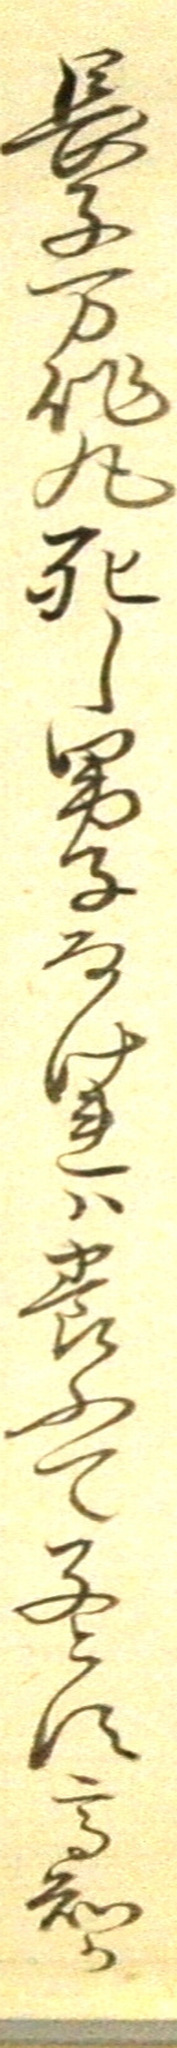長子万作丸死し男子なけれは養ふて子とす高知か
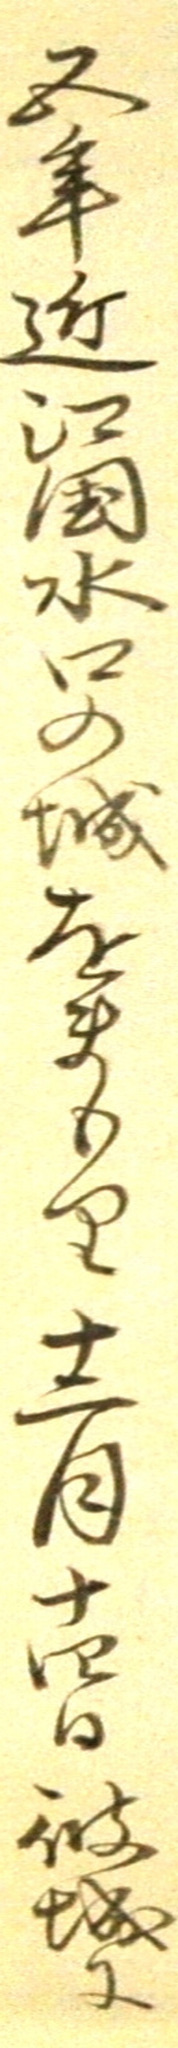五年近江国水口の城をまもり十二月十四日彼城に

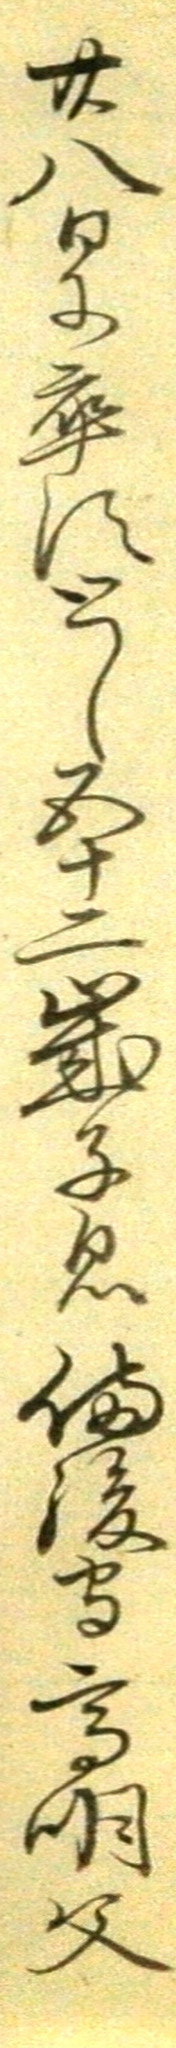廿八日に卒すとし五十二歳子息備後守高明父
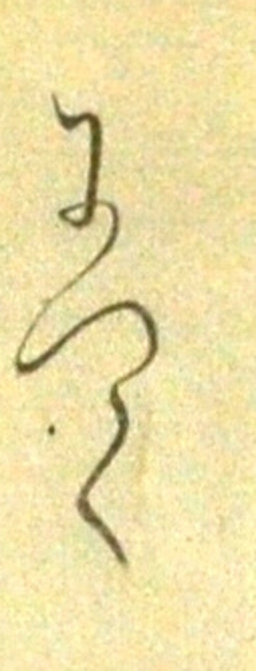につく
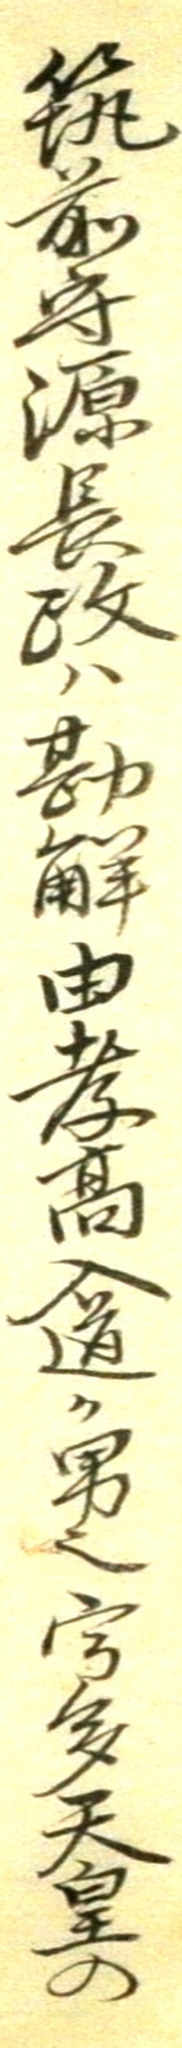筑前守源長政は勘解由孝高入道か男也宇多天皇の
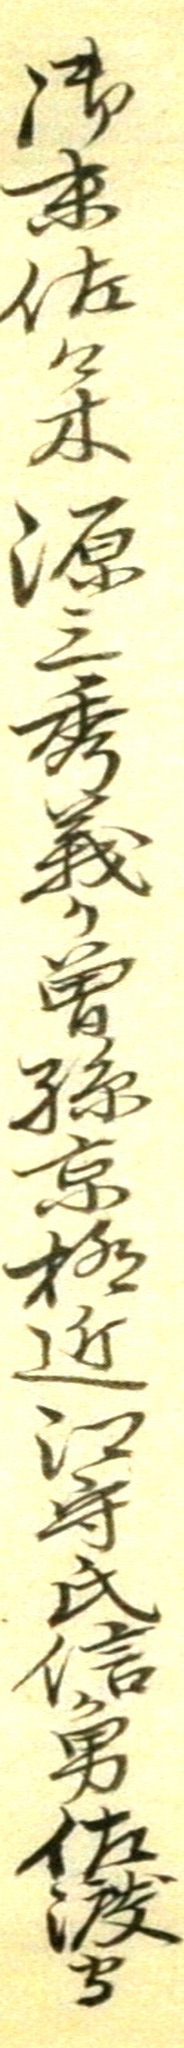御末佐々木源三秀義か曽孫京極近江守氏信か男佐渡守
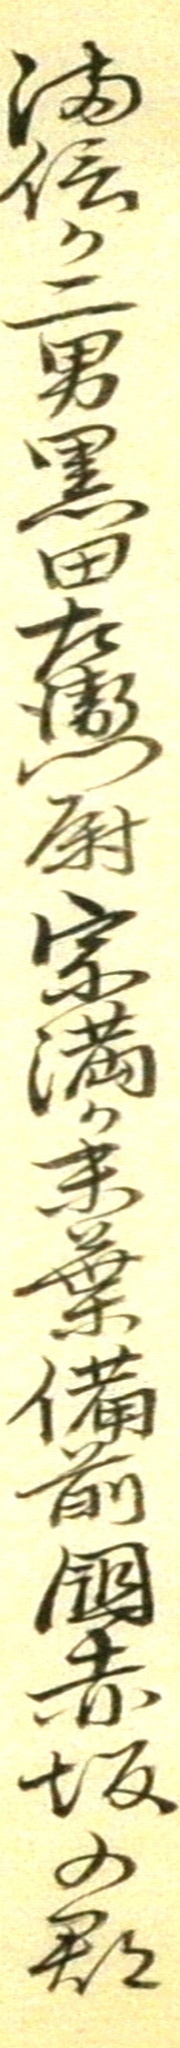満信か二男黒田左衛門尉宗満か末葉備前国赤坂の郡
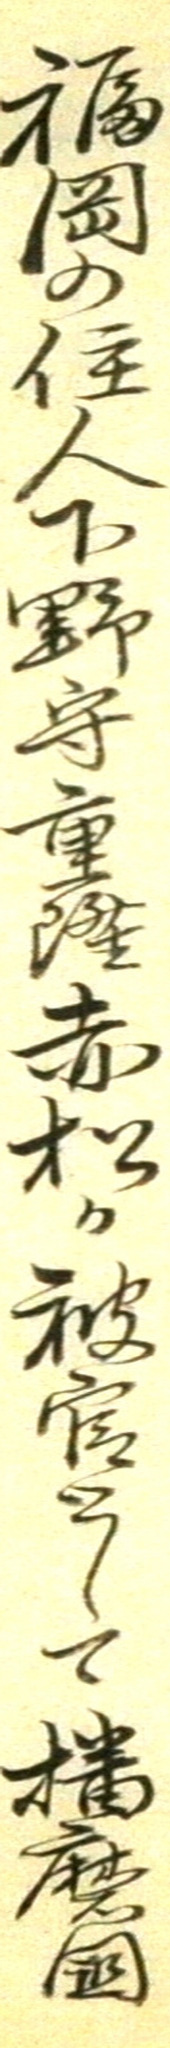福岡の住人下野守重隆赤松か被官として播磨国
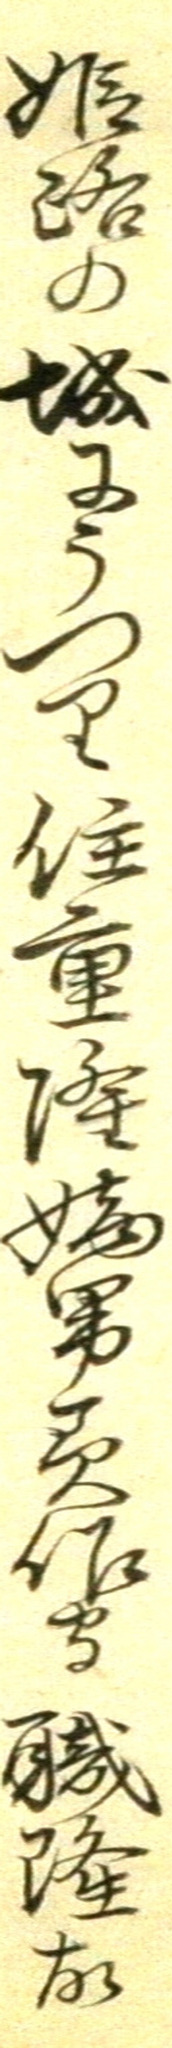姫路の城にうつり住重隆嫡男美作守職隆故
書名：藩翰譜（七・上）
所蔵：伊那市立高遠町図書館・合同会社AMANE
